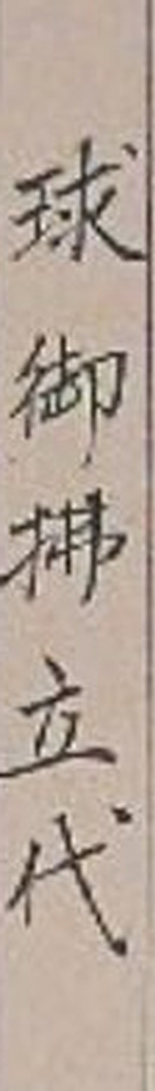球御拂立代
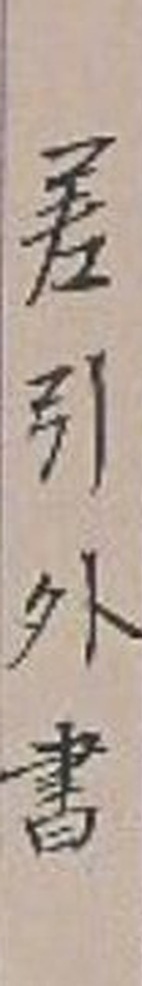差引外書
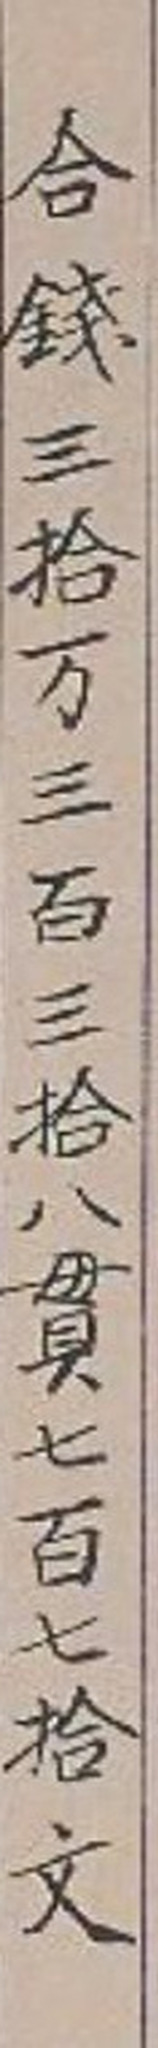合錢三拾万三百三拾八貫七百七拾文
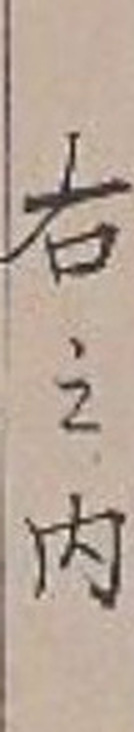右之内
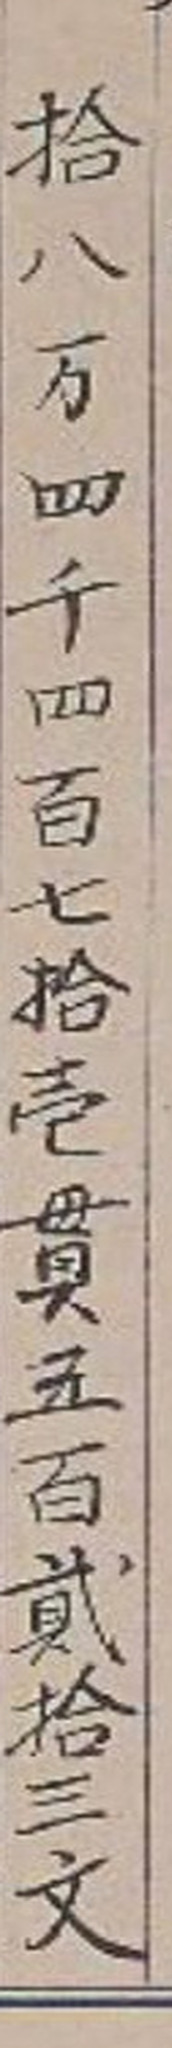拾八万四千四百七拾壱貫五百貳拾三文
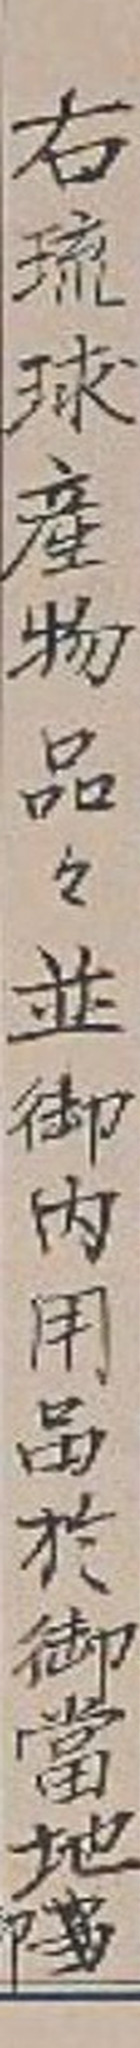右琉球産物品々並御内用品於御當地当
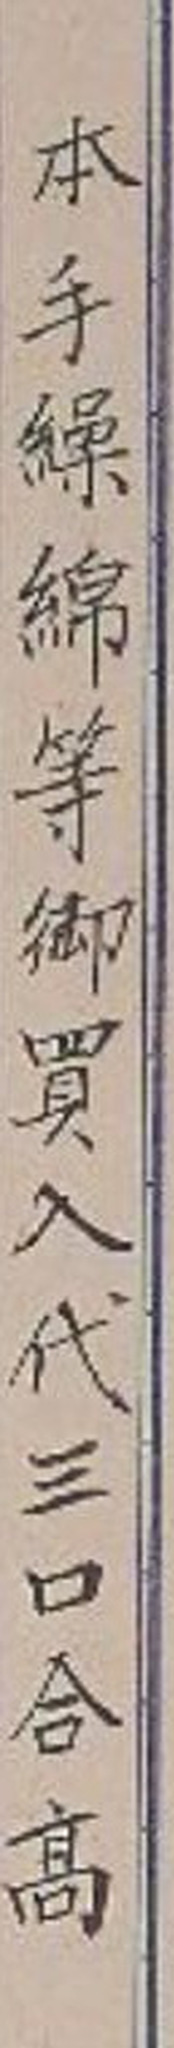本手繰綿等御買入代三口合髙
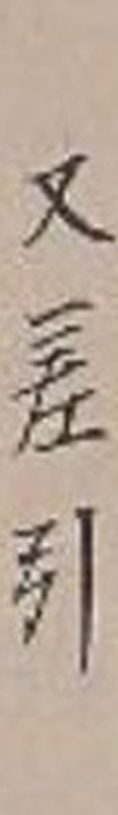又差引
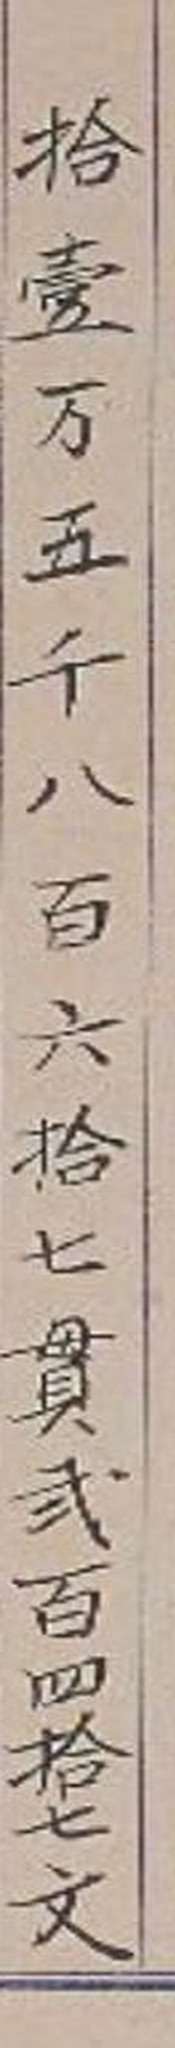拾壹万五千八百六拾七貫弐百四拾七文
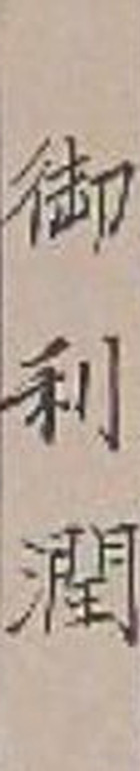御利潤
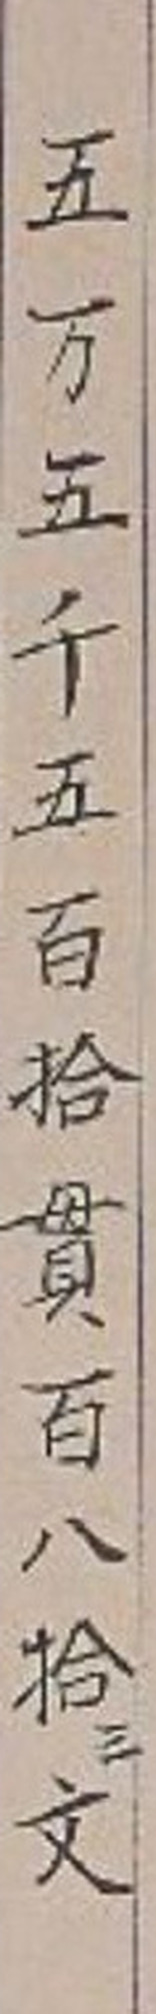五万五千五百拾貫百拾三文
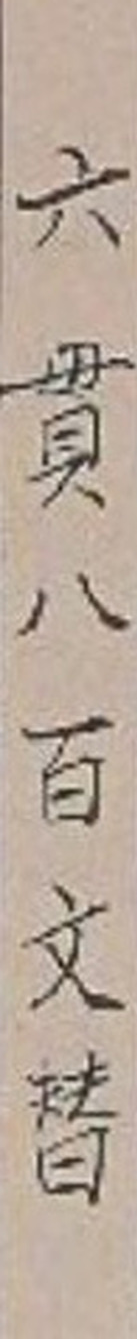六貫八百文替
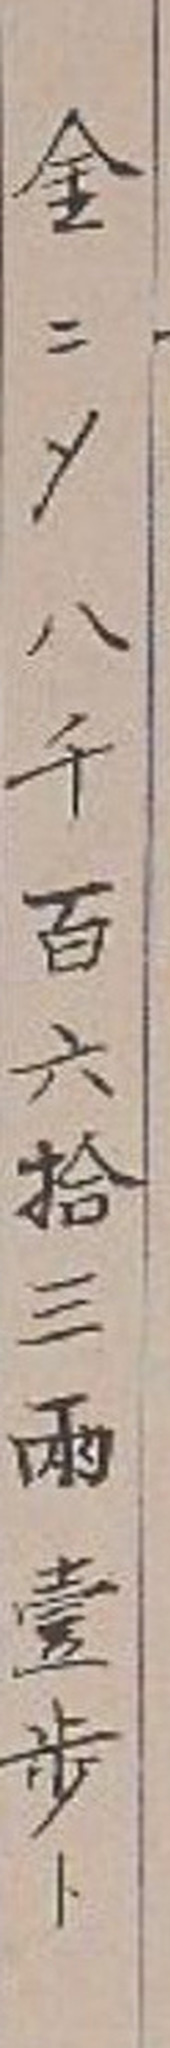金ニシテ八千百六拾三兩壹歩ト
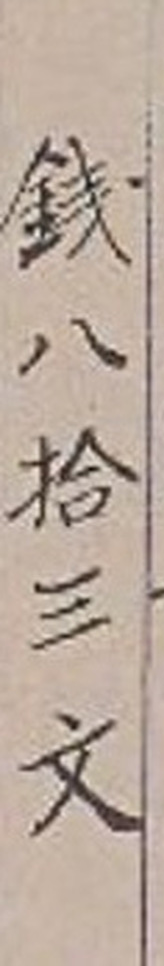銭八拾三文
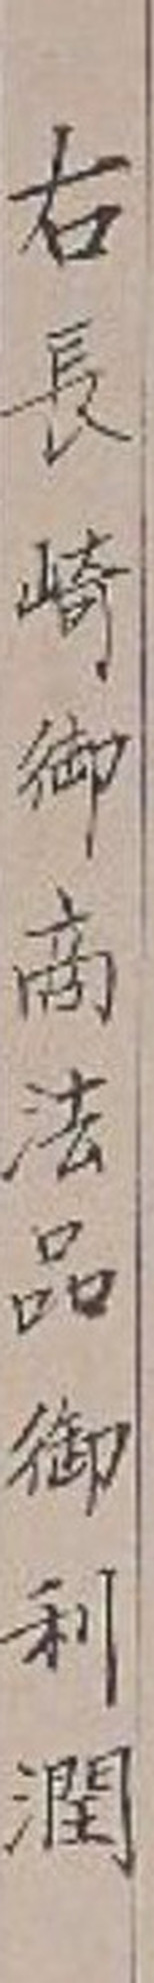右長崎御商法品御利潤

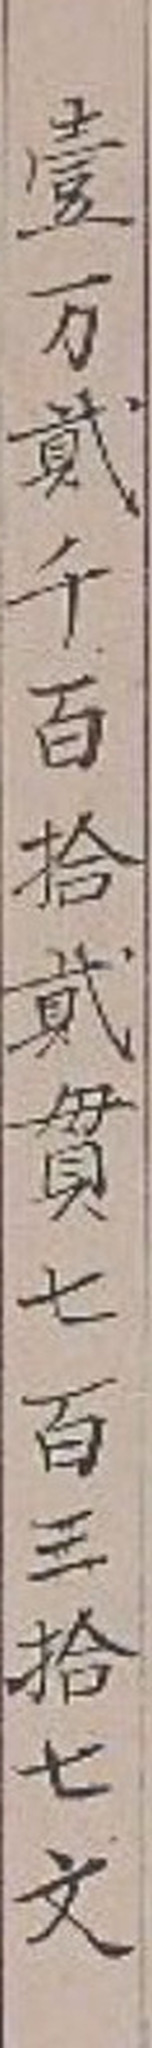壹万貮千百拾貮貫七百三拾七文
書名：琉球産物於長崎拂立並本手品利潤総帖 弘化四年より酉年迄
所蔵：University of the Ryukyus Library
